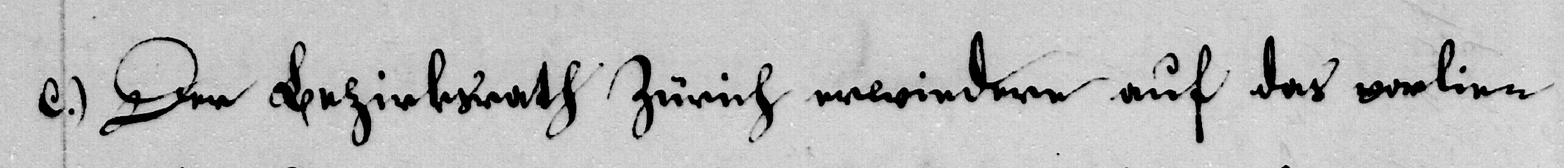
c.) Der Bezirksrath Zürich erwiedere auf das vorlie¬
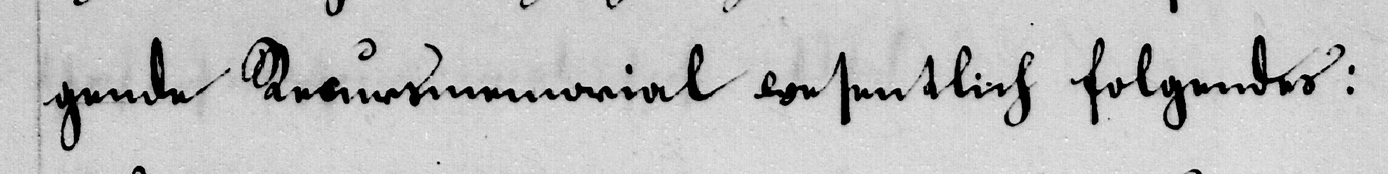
gende Recursmemorial wesentlich folgendes:
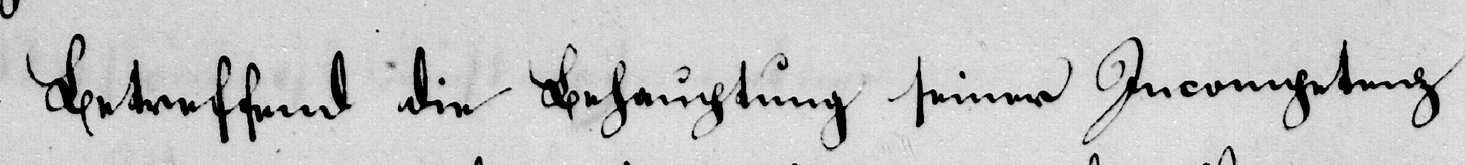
Betreffend die Behauptung seiner Incompetenz
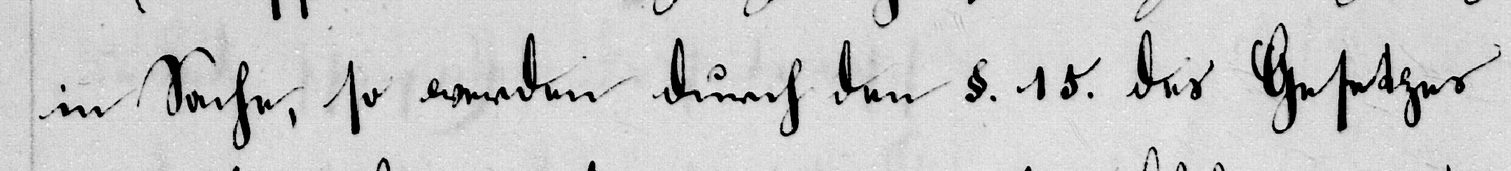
in Sache, so werden durch den §. 15. des Gesetzes
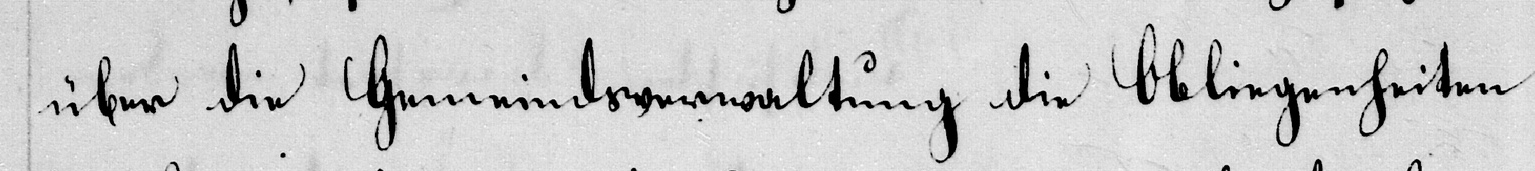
über die Gemeindsverwaltung die Obliegenheiten
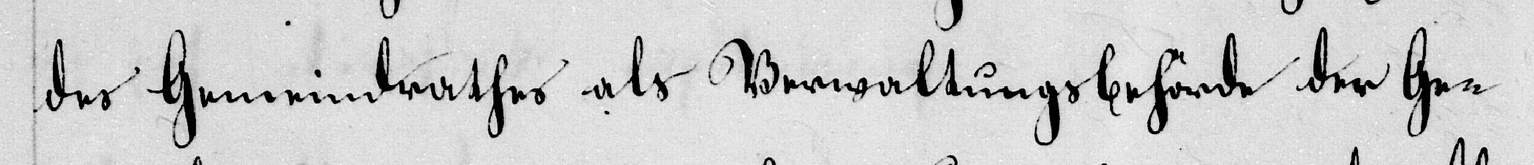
des Gemeindrathes als Verwaltungsbehörde der Ge¬
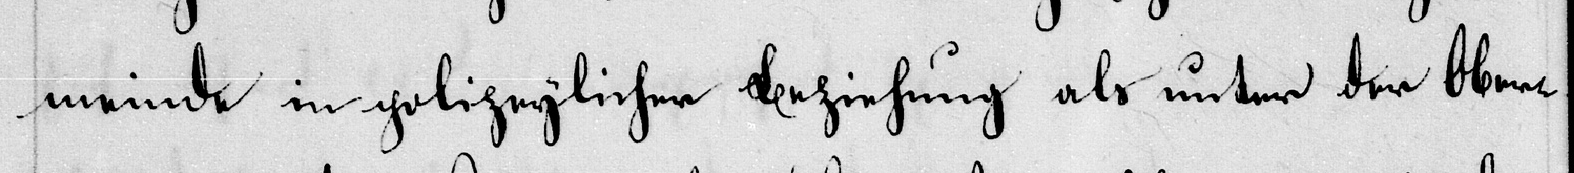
meinde in polizeylicher Beziehung als unter der Ober¬
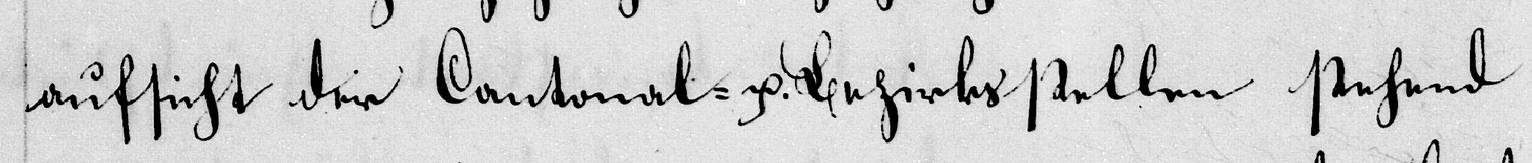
aufsicht der Cantonal- u. Bezirksstellen stehend
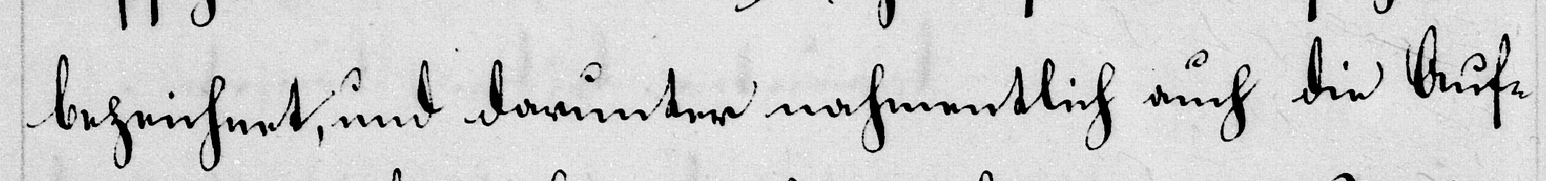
bezeichnet, und darunter nahmentlich auch die Auf¬
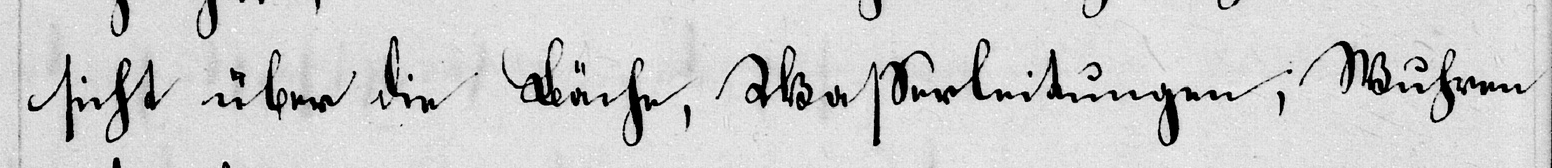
sicht über die Bäche, Waßerleitungen, Wuhren
